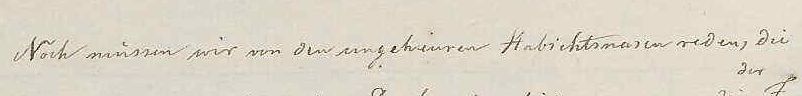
Noch müssen wir von den ungeheuren Habichtsnasen reden, die
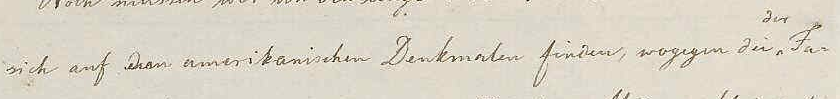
sich auf den amerikanischen Denkmalen finden, wogegen die der
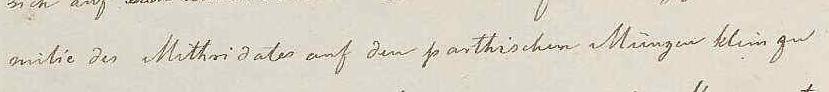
milie des Mithridates auf den parthischen Münzen klein zu
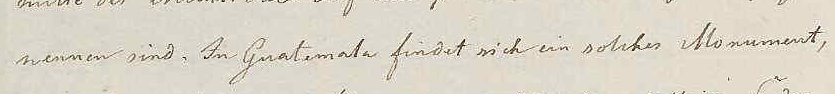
nennen sind. In Guatemala findet sich ein solches Monument,
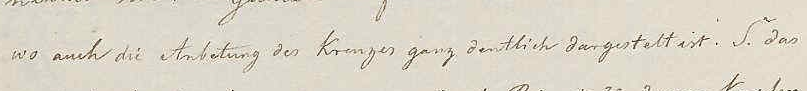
wo auch die Anbetung des Kreuzes ganz deutlich dargestelt ist. S. das
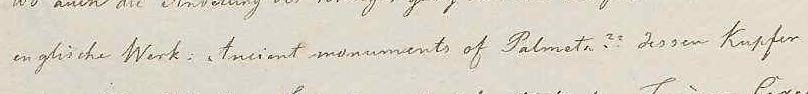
englische Werk: Ancient monuments of Palmeta ?? dessen Kupfer
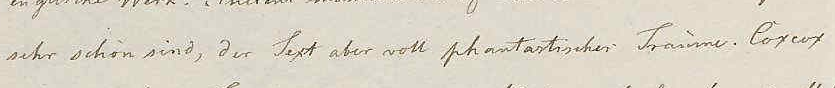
sehr schön sind, der Text aber voll phantastischer Träume. Coxcox
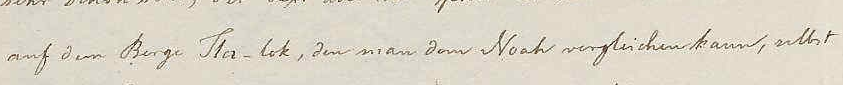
auf dem Berge Tla-lok, den man dem Noah vergleichen kann, selbst
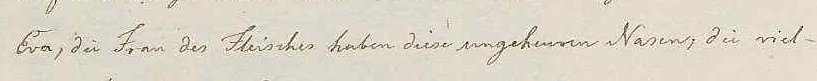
Eva, die Frau des Fleisches haben diese ungeheuren Nasen, die viel-
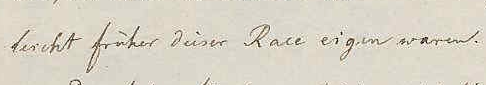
leicht früher dieser Race eigen waren.
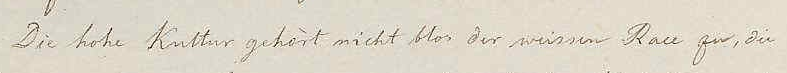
Die hohe Kultur gehört nicht blos der weissen Race zu, die
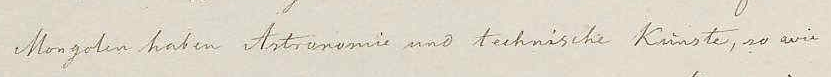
Mongolen haben Astronomie und technische Künste, so wie
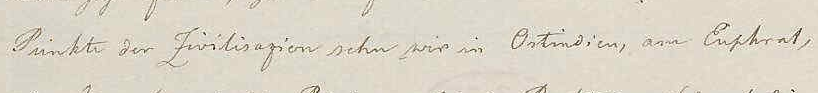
Punkte der Zivilisazion sehn wir in Ostindien, am Euphrat,
